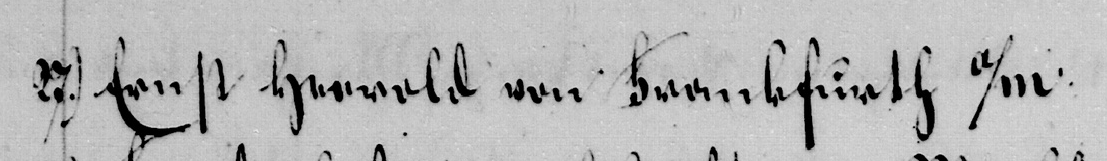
27.) Ernst Herrold von Frankfurth a/m.
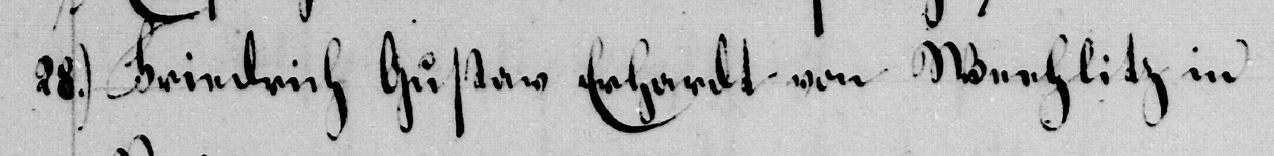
28.) Friedrich Gustav Erhardt von Weehlitz in
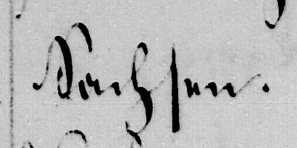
Sachsen.
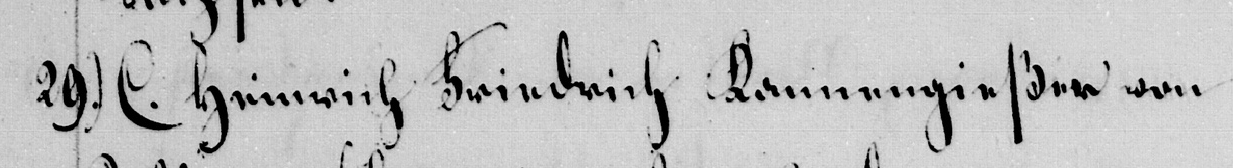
29.) C. Heinrich Friedrich Kannengießer von
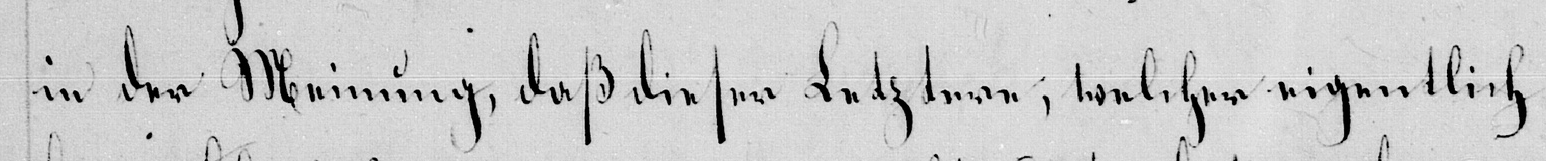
in der Meinung, daß dieser Letztere, welcher eigentlich
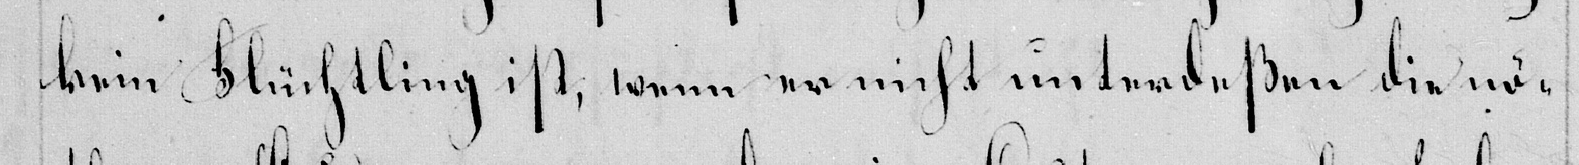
kein Flüchtling ist, wenn er nicht unterdeßen die nö¬
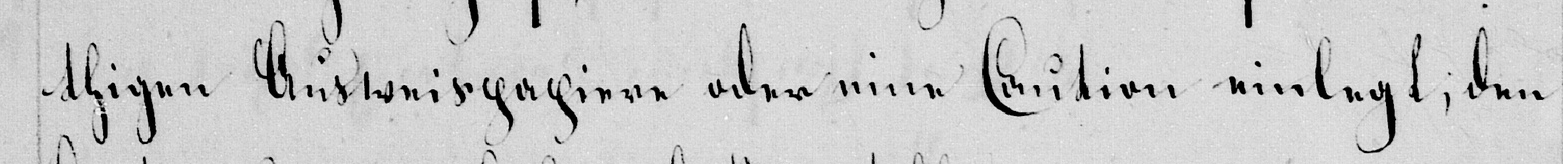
thigen Ausweispapiere oder eine Caution einlegt, den
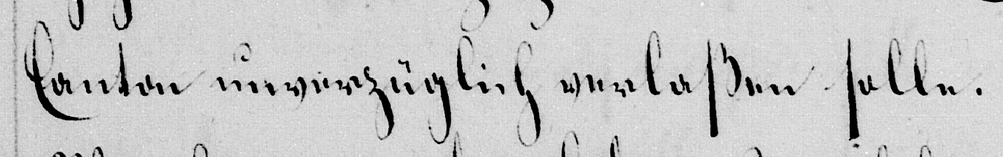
Canton unverzüglich verlaßen solle.
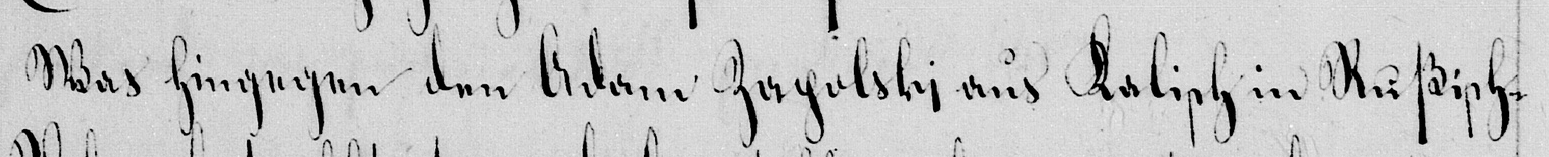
Was hingegen den Adam Zagolski aus Kalisch in Rußisc¬
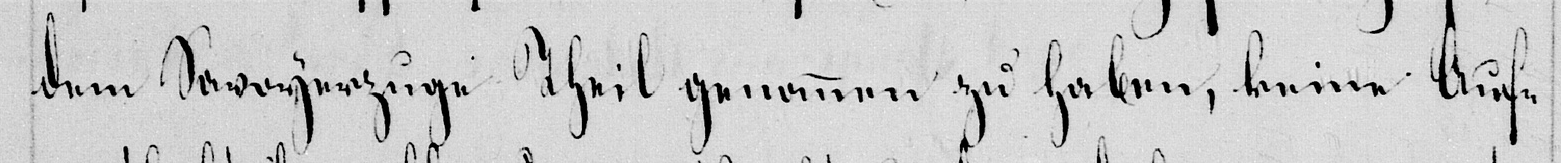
dem Savoyerzuge Theil genommen zu haben, eine Auf¬
